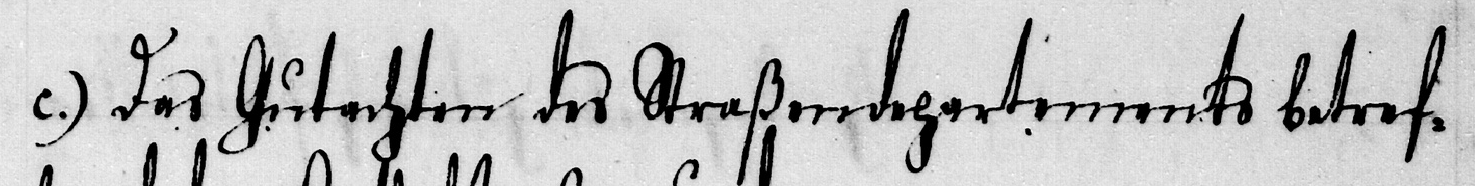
c.) Das Gutachten des Straßendepartements betref¬
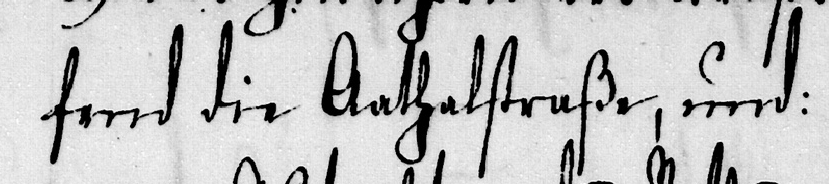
fend die Aathalstraße, und:
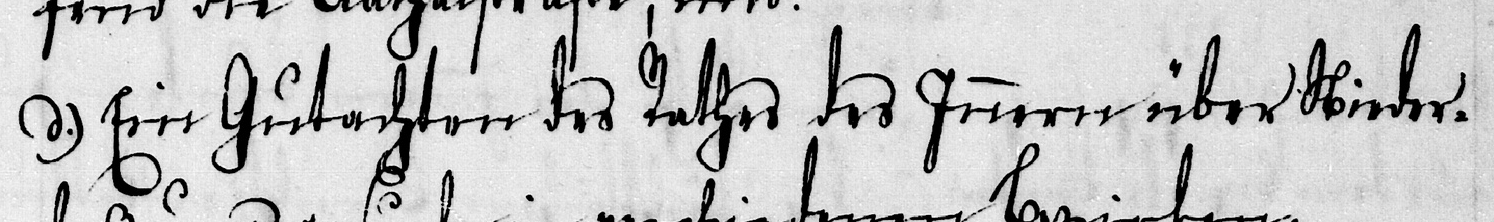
d.) Ein Gutachten des Rathes des Innern über Nieder¬
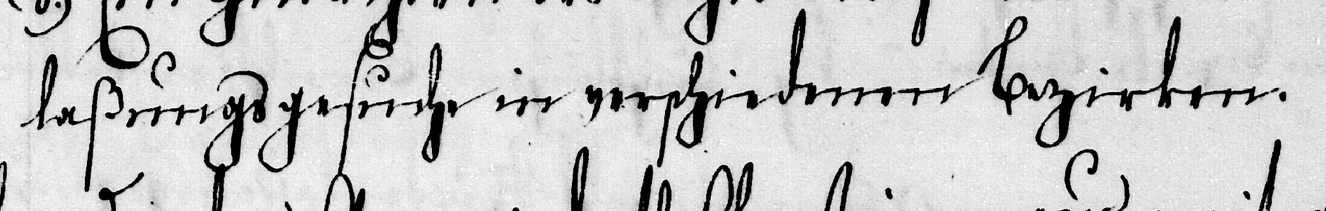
laßungsgesuche in verschiedenen Bezirken.
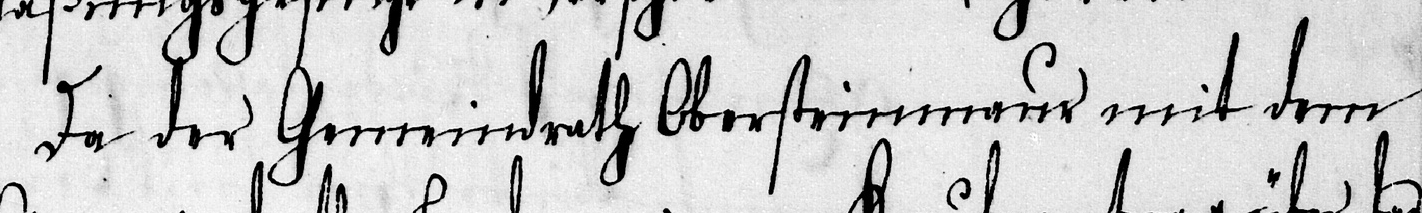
Da der Gemeindrath Obersteinmaur mit dem
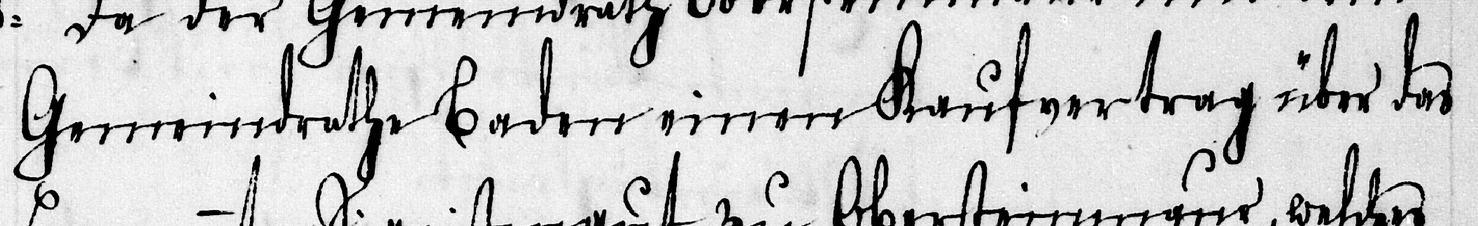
Gemeindrathe Baden einen Kaufvertrag über das
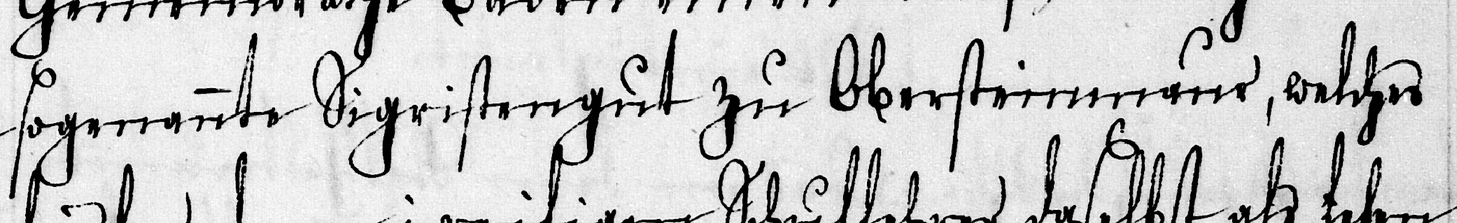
sogenannte Sigristengut zu Obersteinmaur, welches
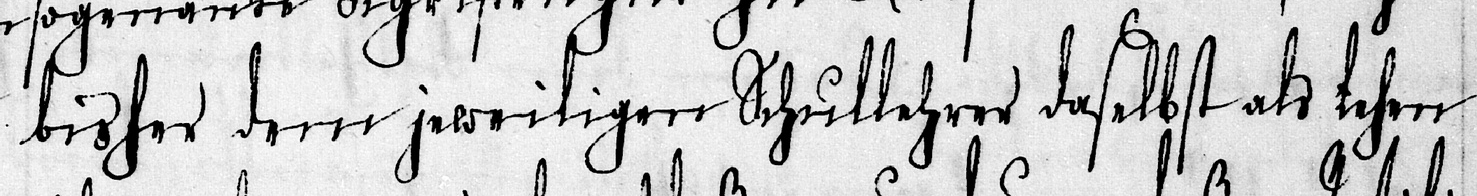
bisher dem jeweiligen Schullehrer daselbst als Lehen
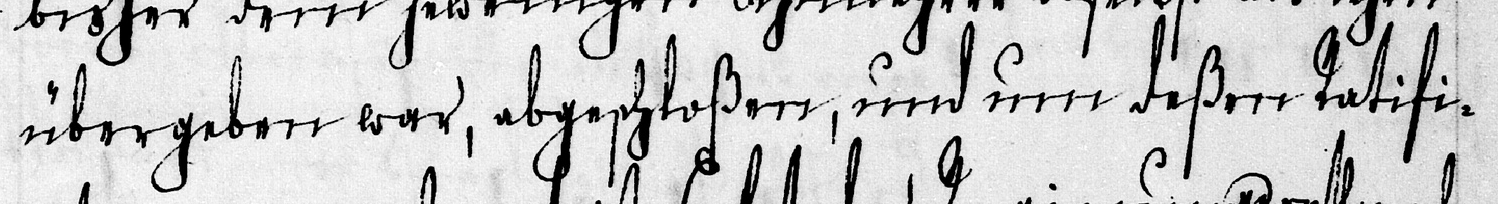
übergeben war, abgeschloßen, und um deßen Ratifi¬
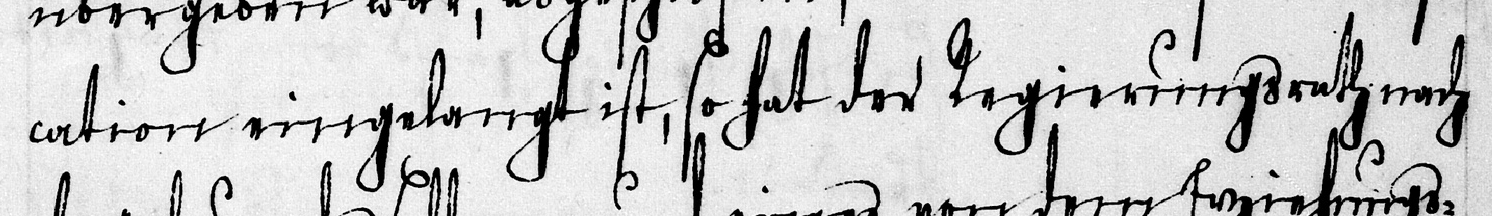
cation eingelangt ist, so hat der Regierungsrath nach
